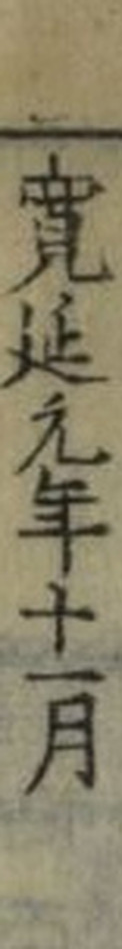寛延元年十一月同
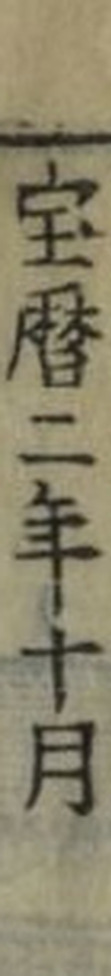宝暦二年十月同
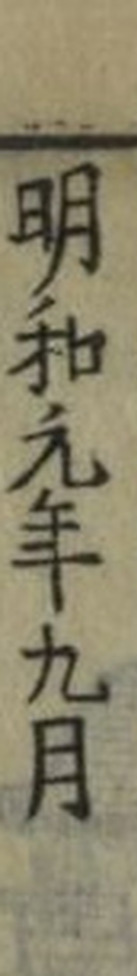明和元年九月同
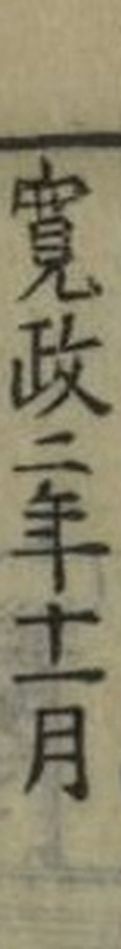寛政二年十一月同
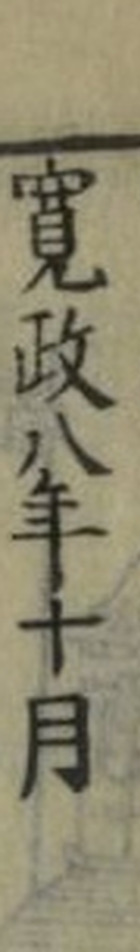寬政八年十月同
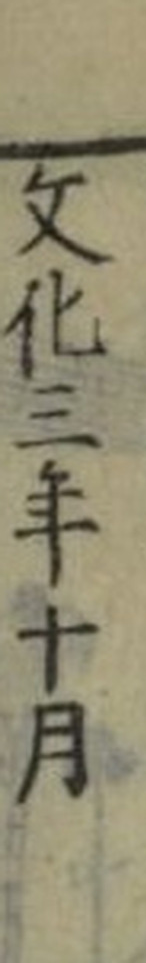文化三年十月同
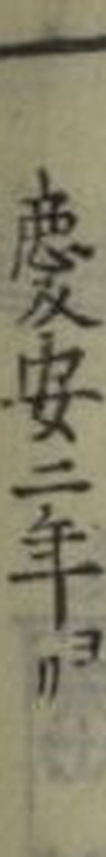慶安二年ヨリ
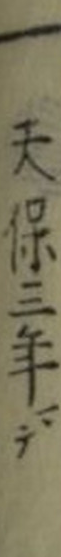天保三年マテ
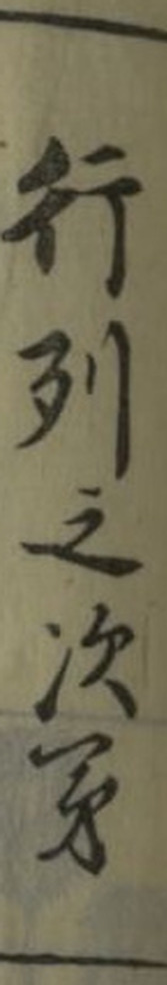行列之次第
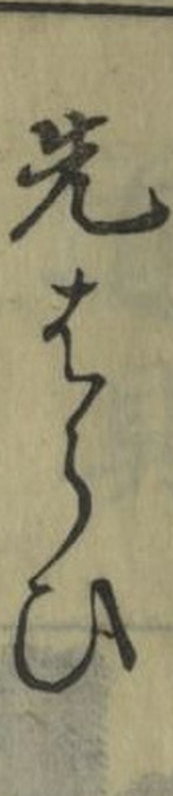先はらひ

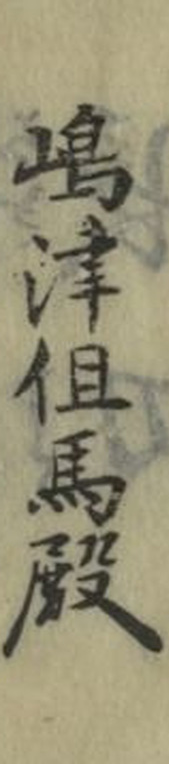島津但馬殿
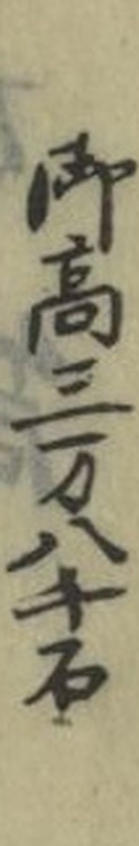御高三万八千石

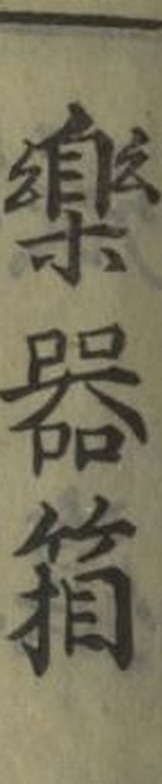楽器箱
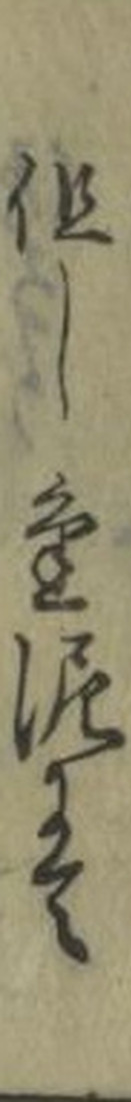但し金泥にて
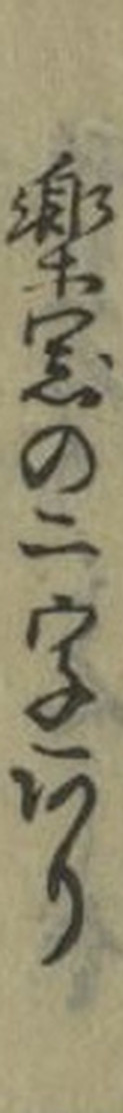楽器の二字あり
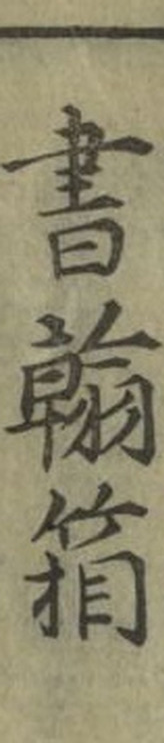書翰箱
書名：琉球人行列記
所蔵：University of the Ryukyus Library
